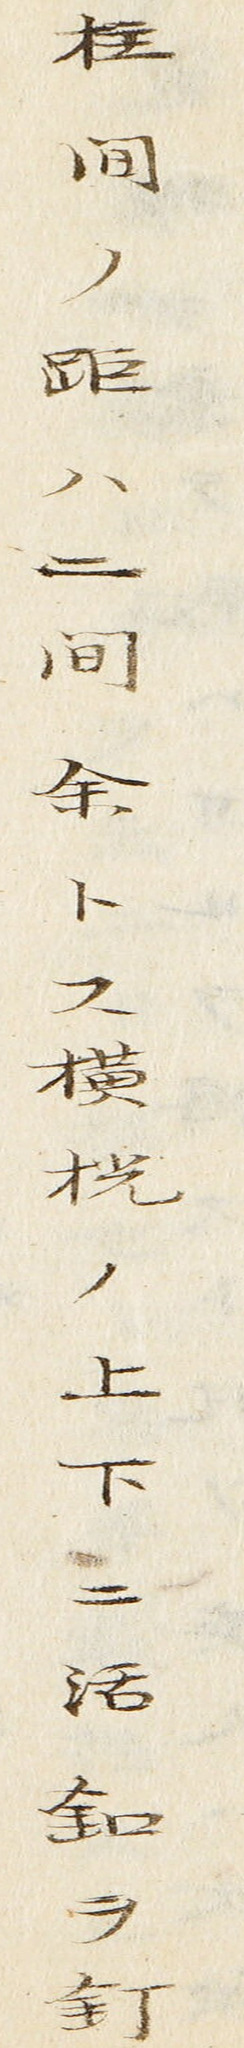柱間ノ距ハ二間余トス横桄ノ上下ニ活釦ヲ釘
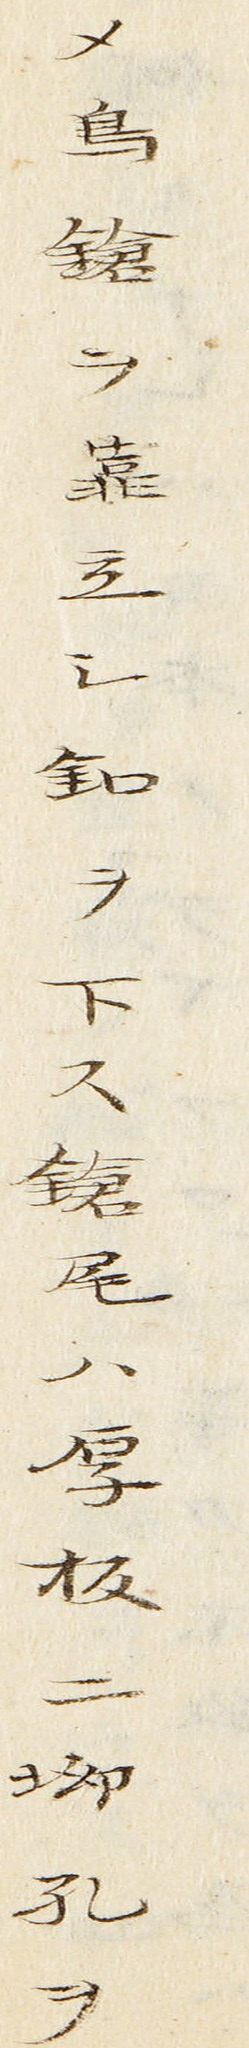シテ鳥鎗ヲ靠立シ釦ヲ下ス鎗尾ハ厚板ニ坳孔ヲ
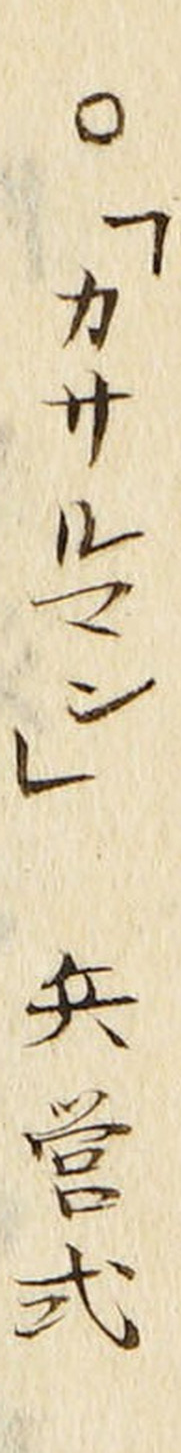◦「カサルマン」兵営式
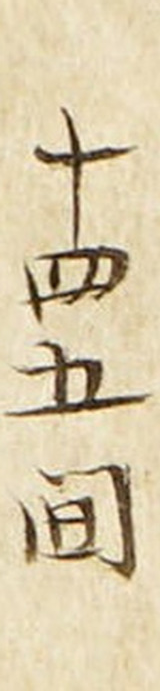十四五間

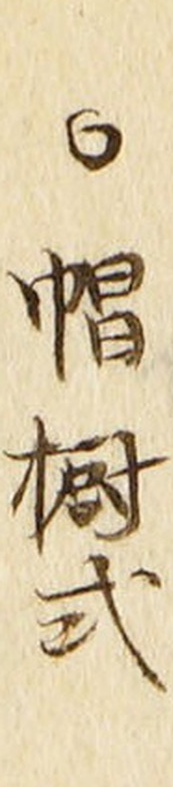◦帽樹式
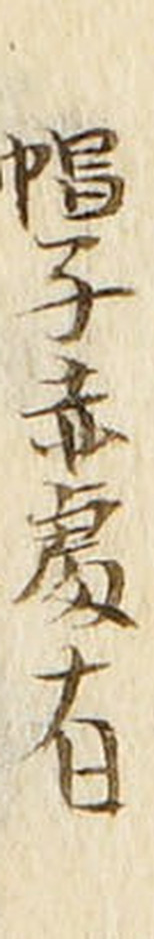帽子赤処有
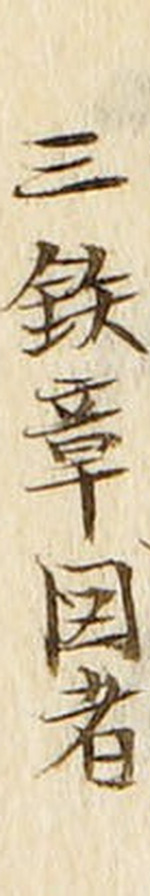三鉄章図者
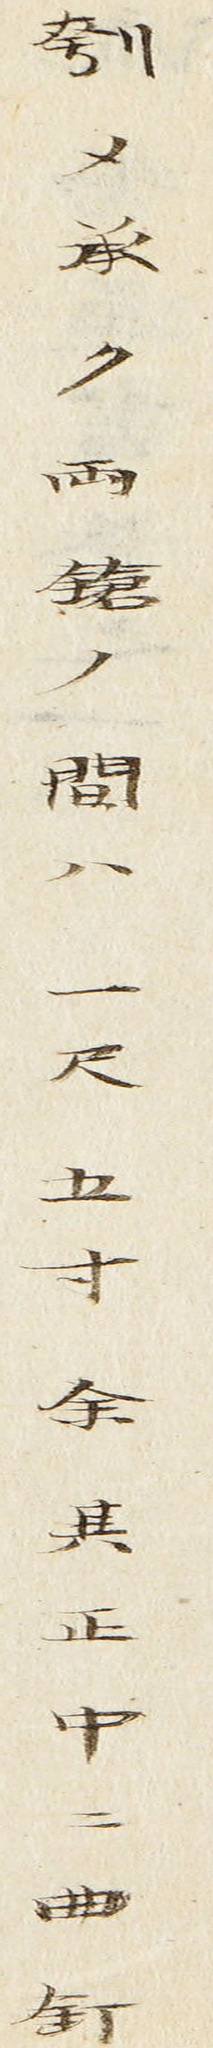刳して承ク両鎗ノ間ハ一尺五寸余其正中ニ曲釘
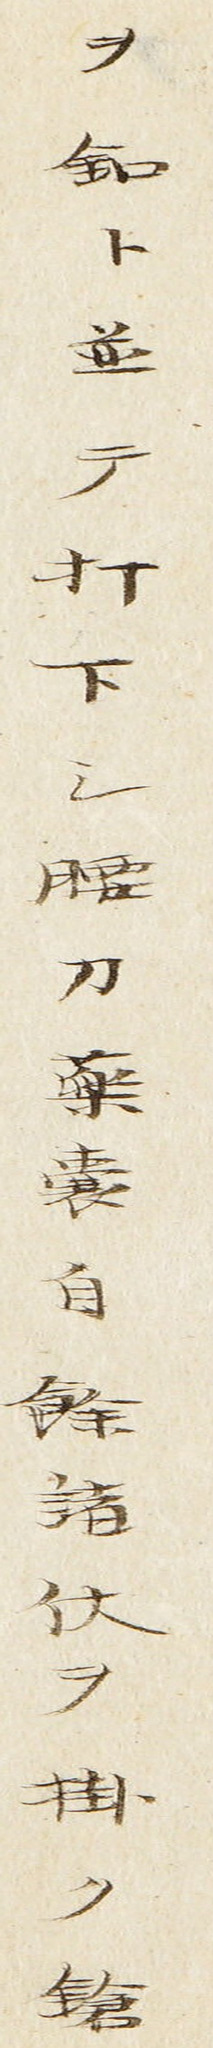ヲ釦ト並テ打下シ腰刀薬嚢自余諸仗ヲ掛ク鎗
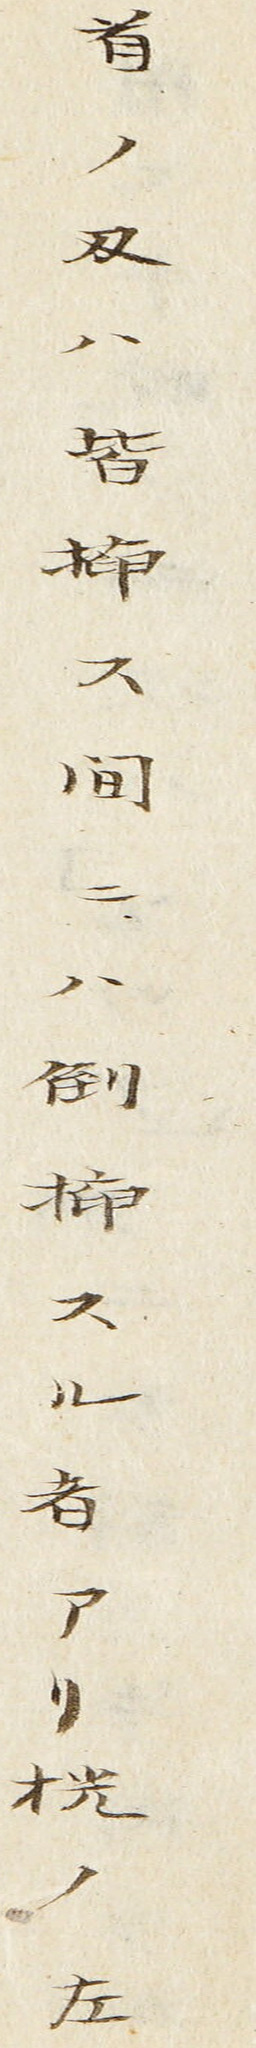首ノ刃ハ皆挿ス間ニハ倒挿スル者アリ桄ノ左
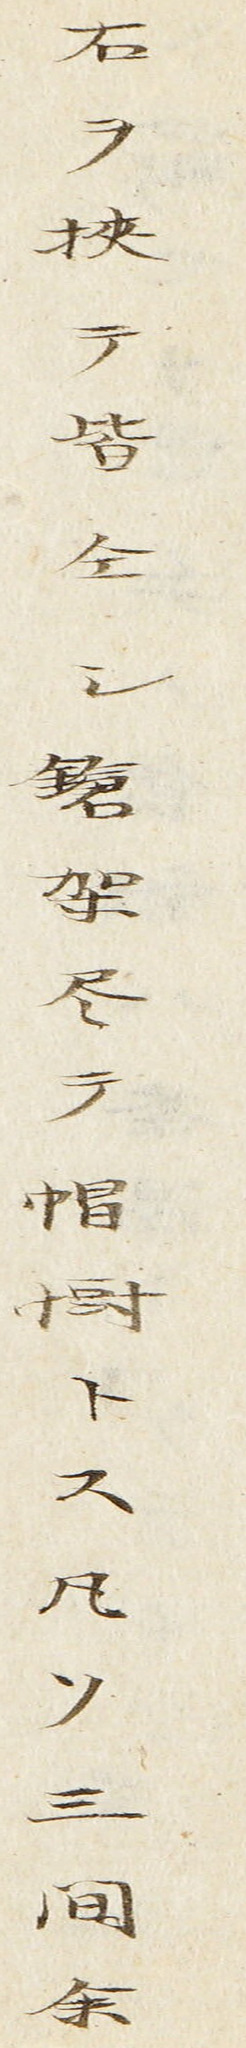右ヲ挟テ皆仝シ鎗架尽テ帽樹トス凡ソ三間余
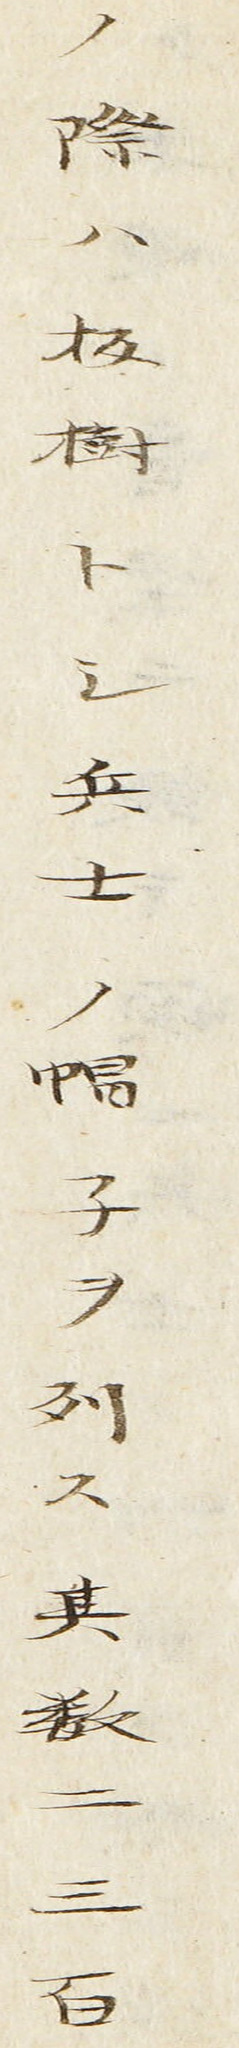ノ際ハ板樹トシ兵士ノ帽子ヲ列ス其数二三百
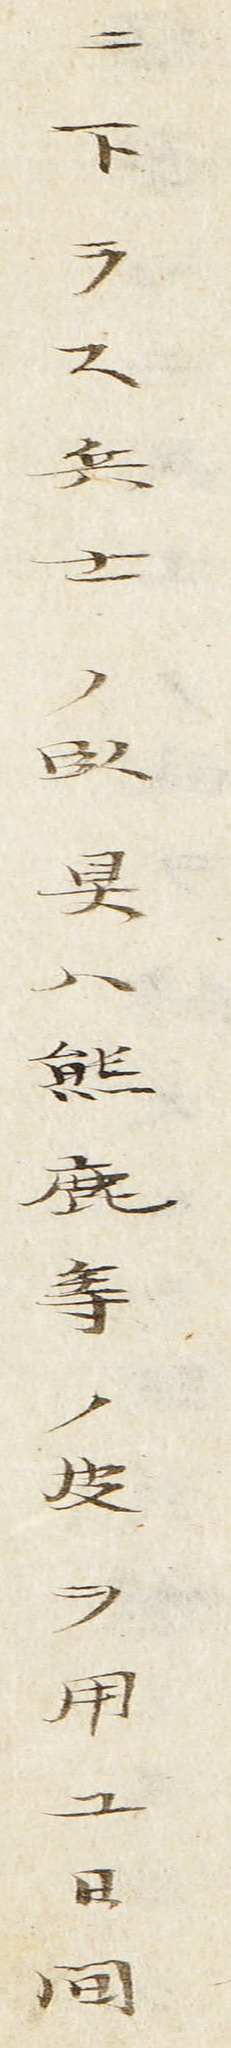ニ下ラス兵士ノ臥具ハ熊鹿等ノ皮ヲ用ユ日間
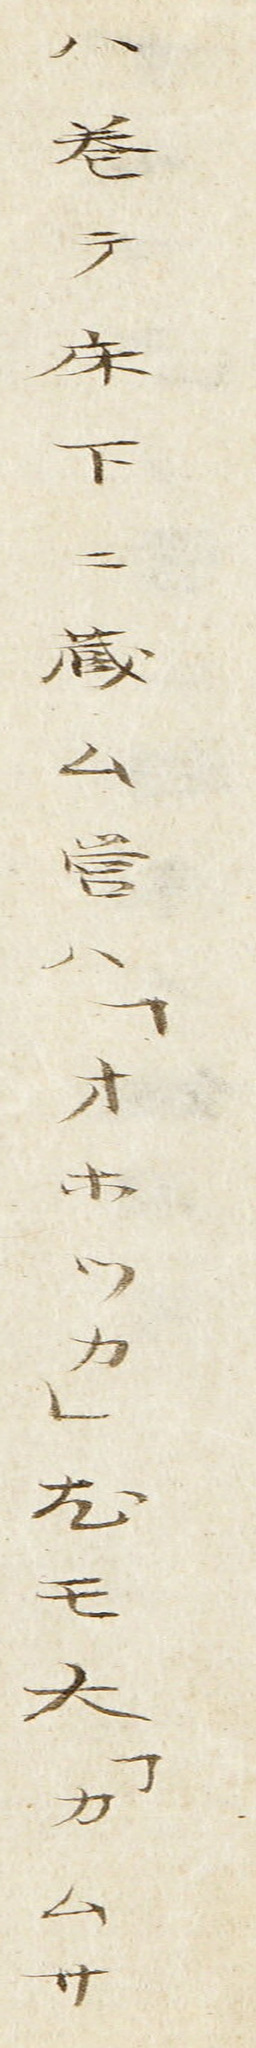ハ巻テ床下ニ蔵ム営ハ「オホツカ」尤モ大「カムサ
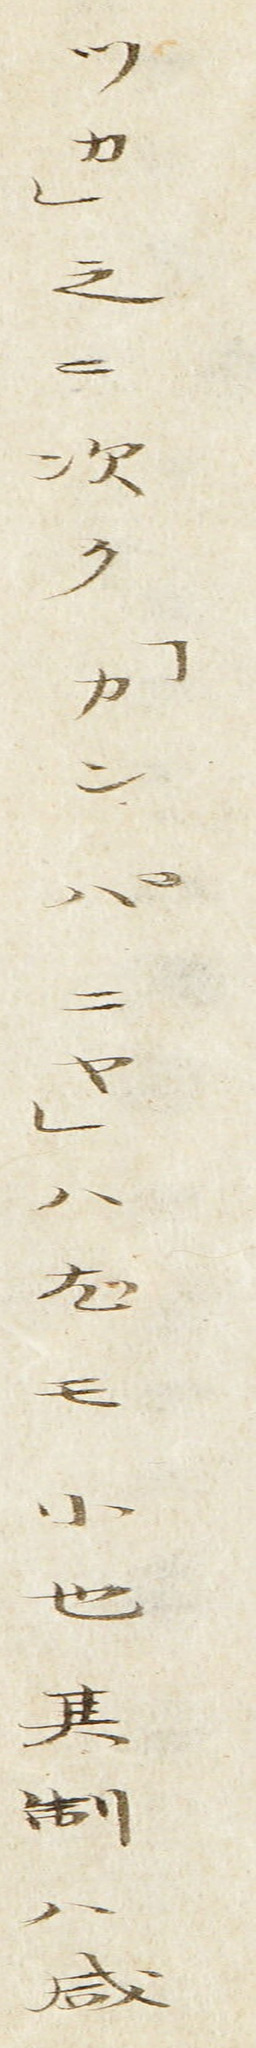ツカ」之ニ次ク「カンパニヤ」ハ尤モ小也其制ハ咸
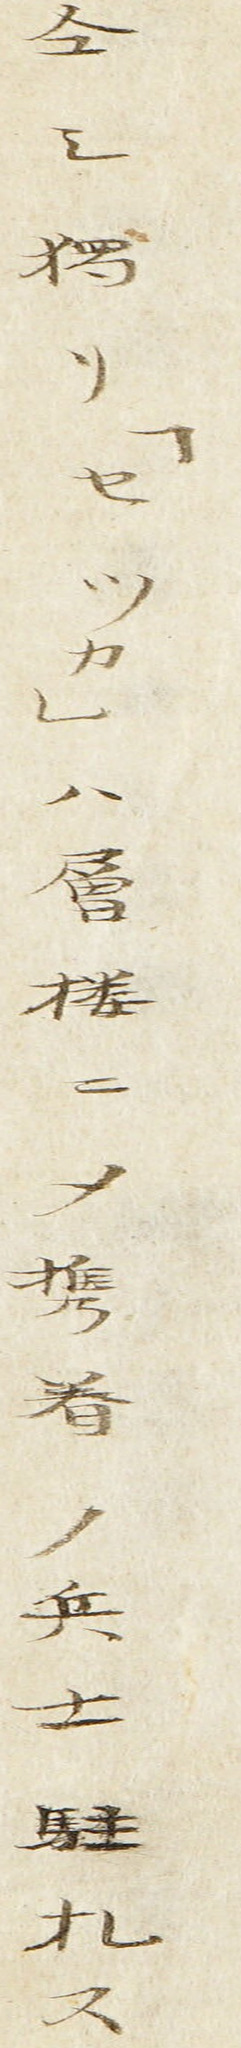仝シ独リ「セツカ」ハ層楼ニシテ携眷ノ兵士駐札ス
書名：流蕃通書
